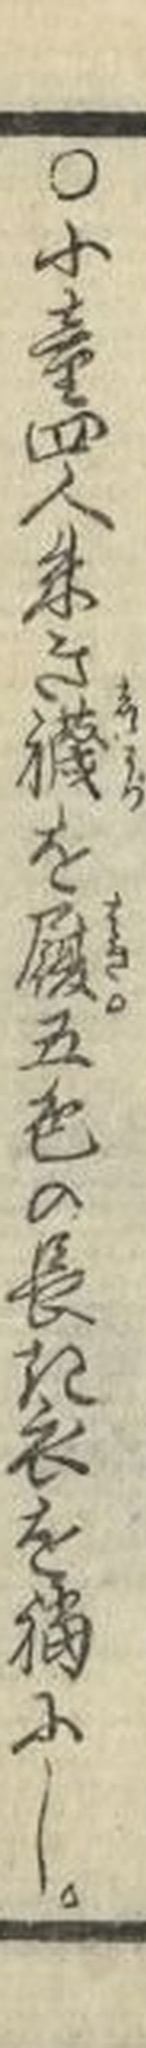○小童四人朱き襪を履。五色の長き衣を襠にし。
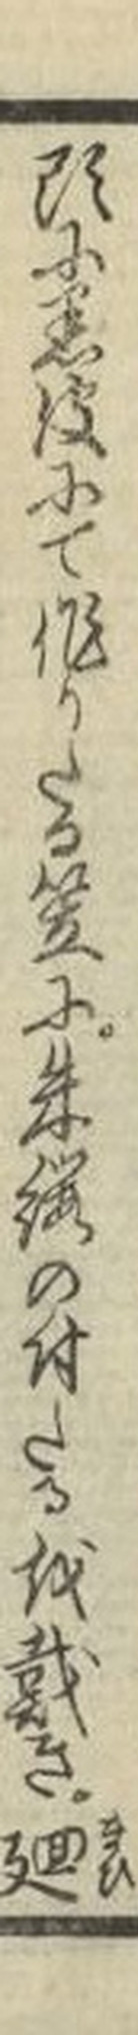頭に黒皮にて作りたる笠に。朱纓の付たるを戴き。廻
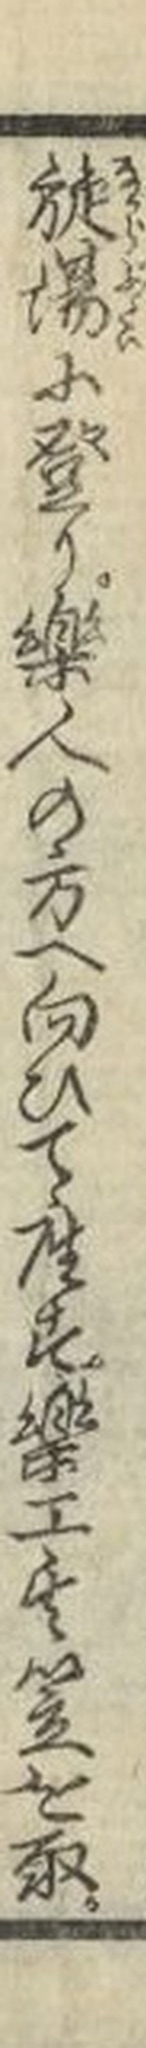旋場に登り。楽人の方へ向ひて座す。楽工其笠を取。
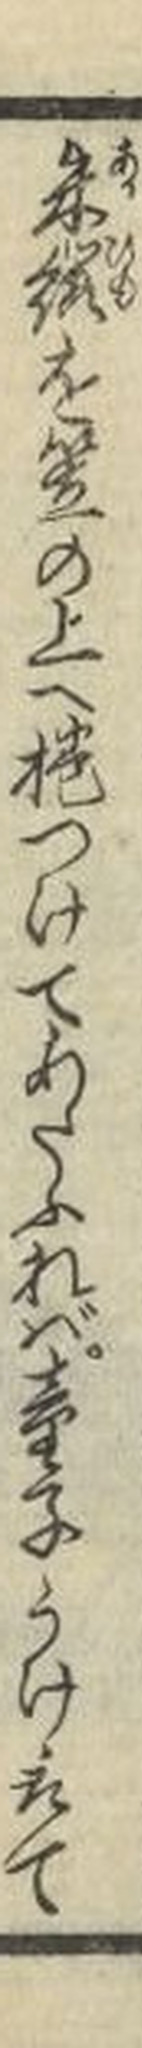朱纓を笠の上へ捲つけてあたふれば。童子うけ取て
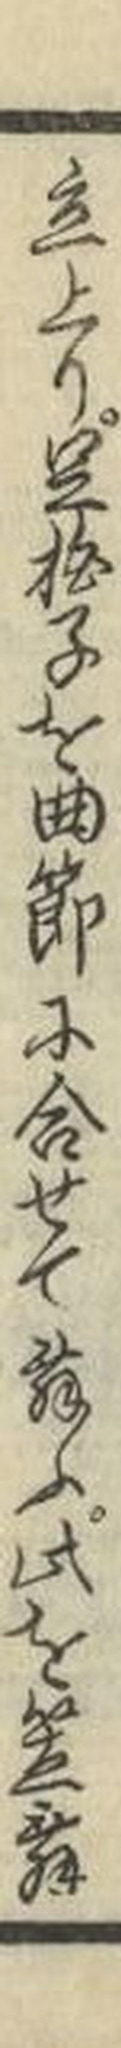立上り。足拍子を曲節に合せて舞ふ。此を笠舞
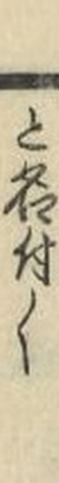と名付く
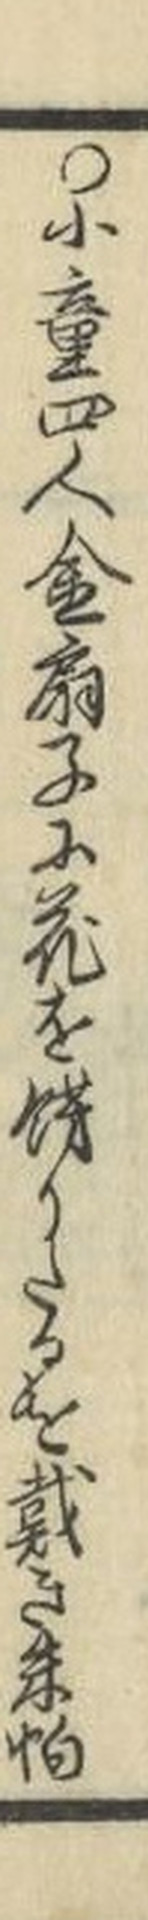○小童四人金扇子に花を餝りたるを戴き朱帕
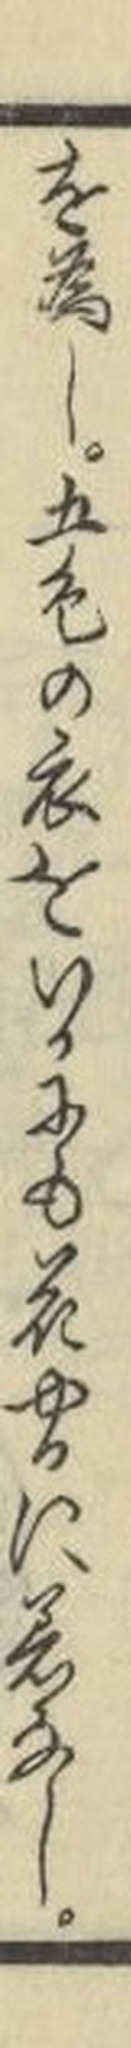を為し。五色の衣をいかにも花やかに着なし。
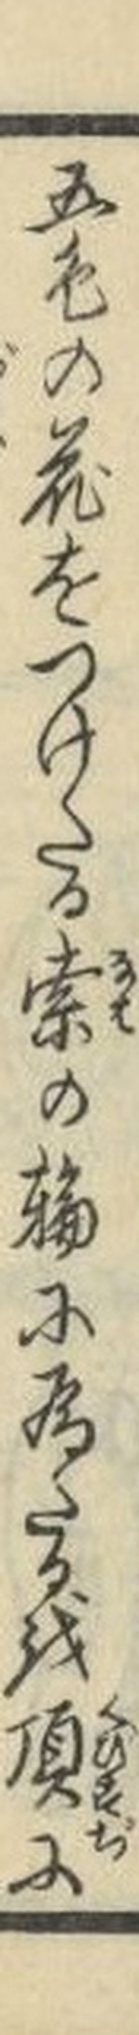五色の花をつけたる索の輪に為たるを頂に
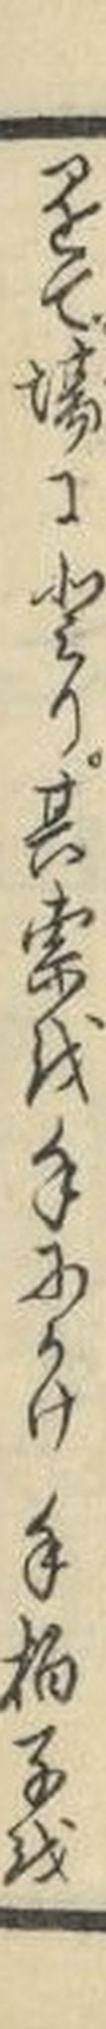懸て。場に登り。其索を手にかけ手拍子を
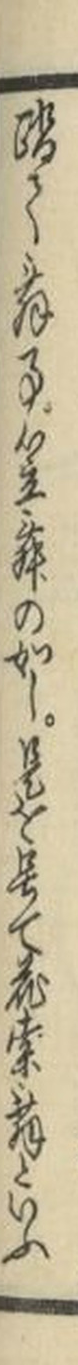踏て舞事。笠舞の如し。是を号て花索舞といふ
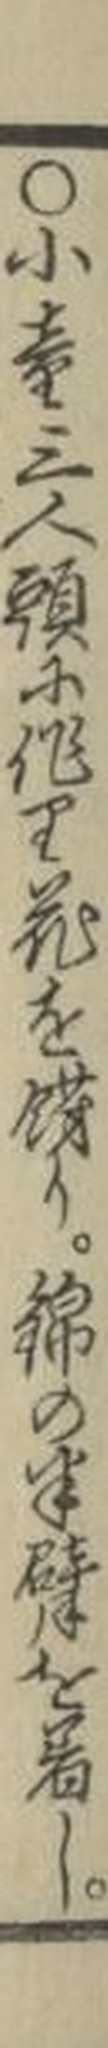○小童三人頭に作り花を餝り。錦の半臂を着し。
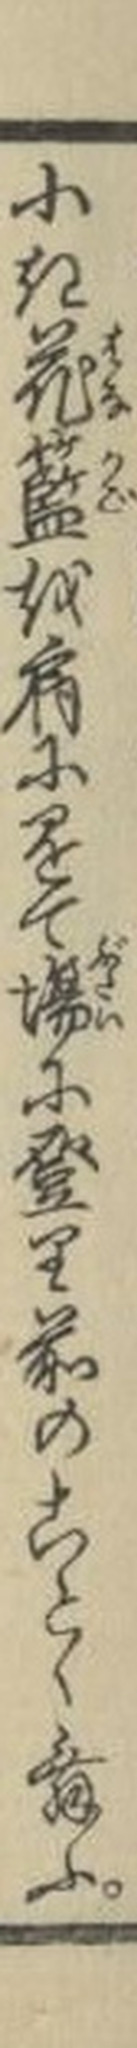小き花籃を肩に懸て場に登り前のことく舞ふ。
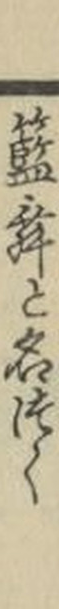籃舞と名つく
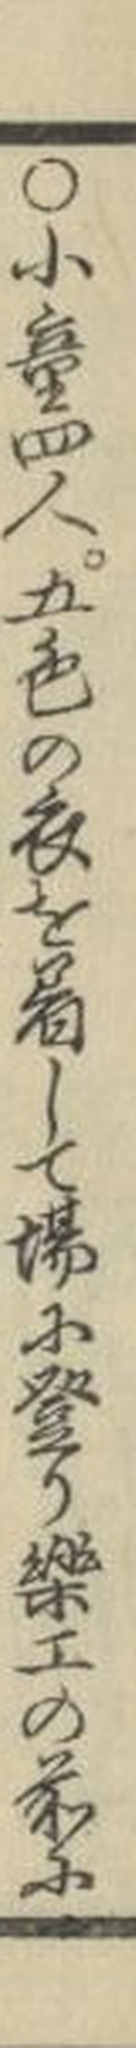○小童四人。五色の衣を着して場に登り楽工の前に
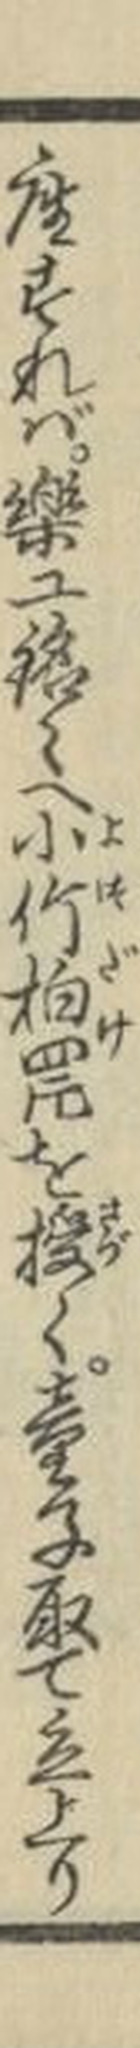座すれば。楽工銘々へ小竹拍四片を授く。童子取て立上り
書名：琉球解語
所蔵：University of the Ryukyus Library
